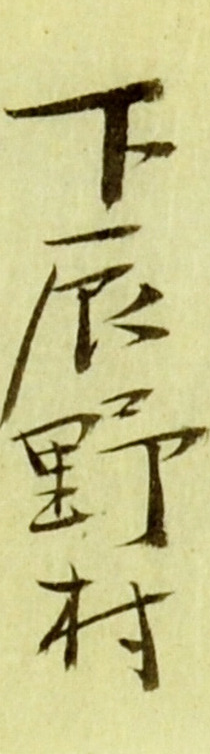下辰野村

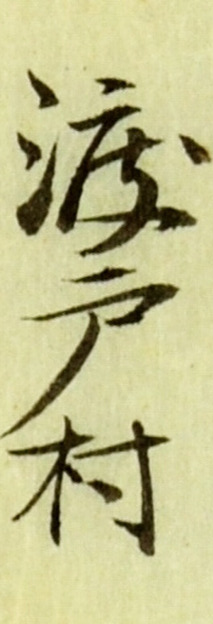渡戸村
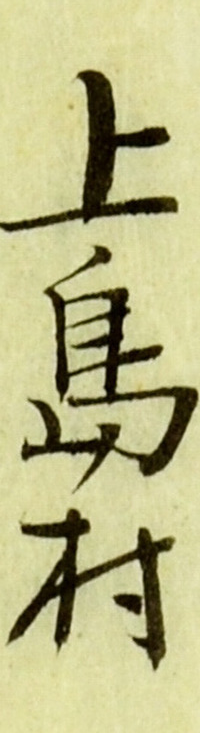上島村
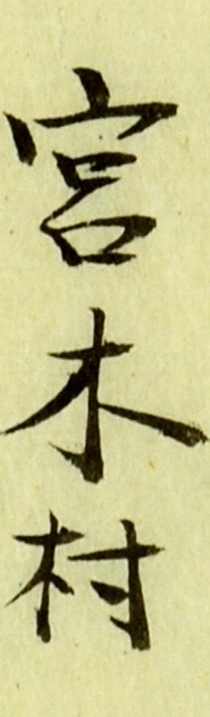宮木村
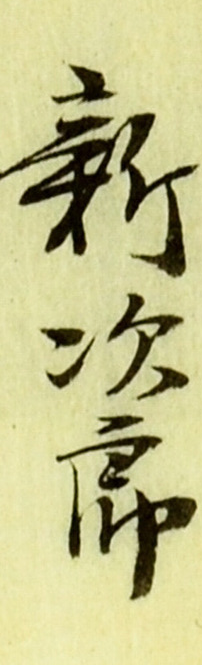新次郎
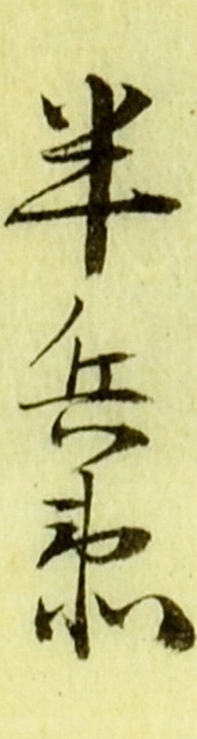半兵衛
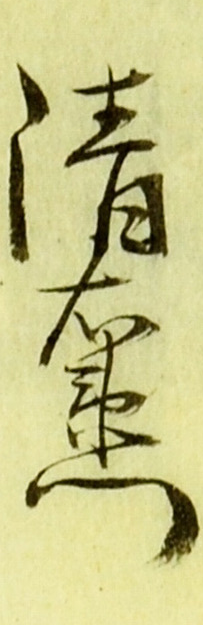清右衛門
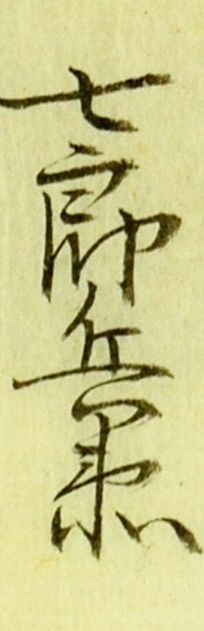七郎兵衛
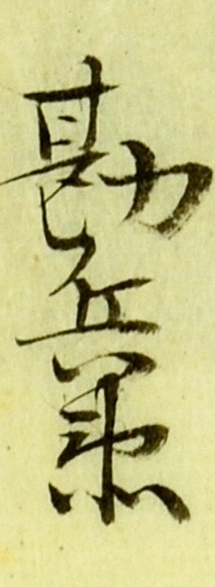勘兵衛
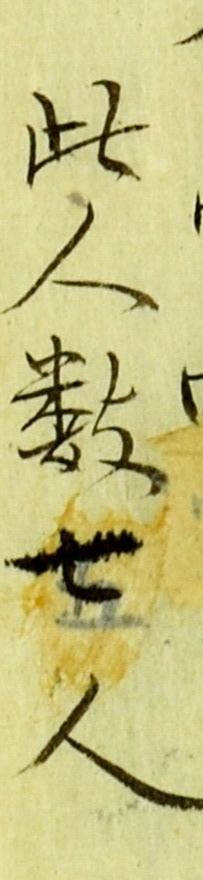此人数七人
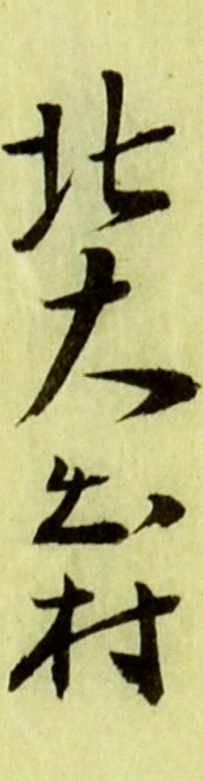北大出村
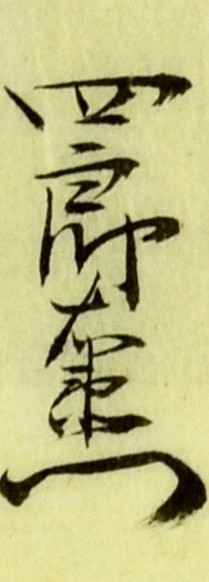四郎右衛門
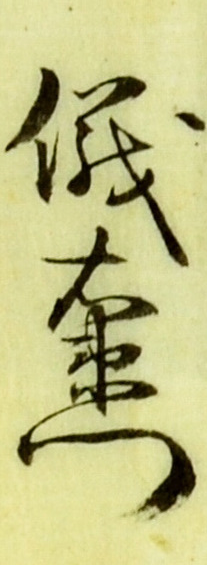儀右衛門
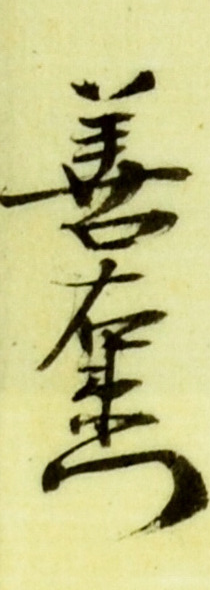清右衛門
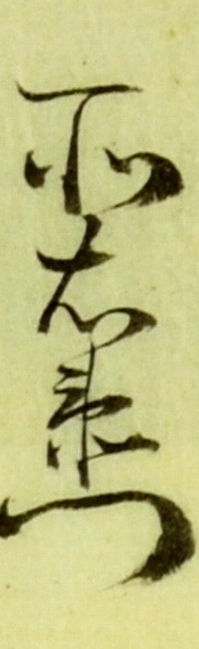清右衛門

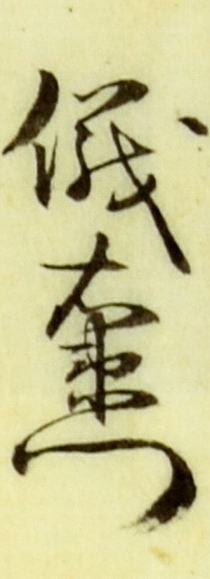善右衛門
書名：上伊那郷諸運上取調帳
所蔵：伊那市立高遠町図書館・合同会社AMANE
